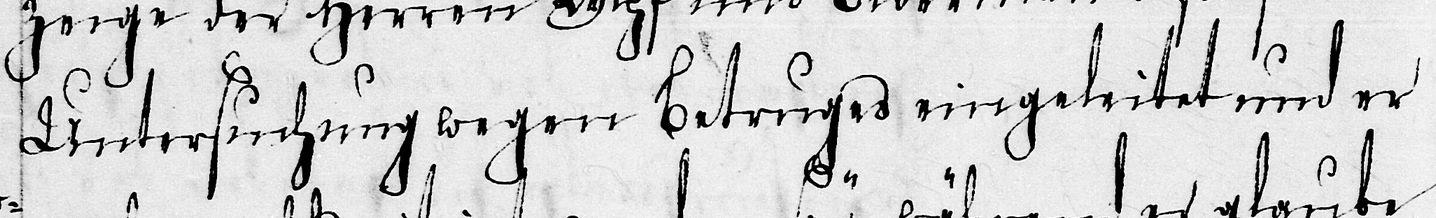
Untersuchung wegen Betruges eingeleitet und er
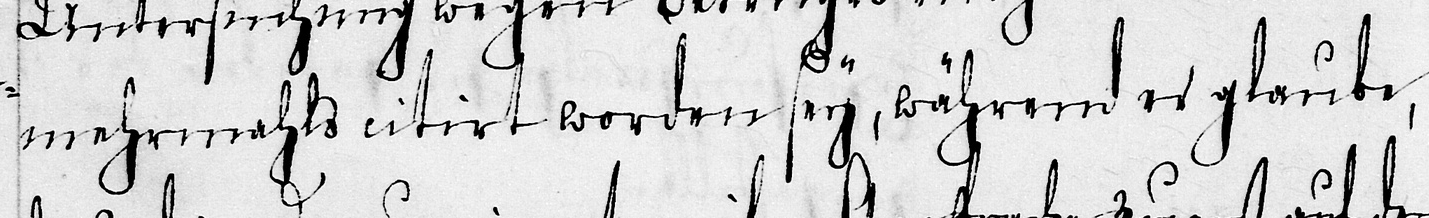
mehrmahls citirt worden sey, während er glaube,
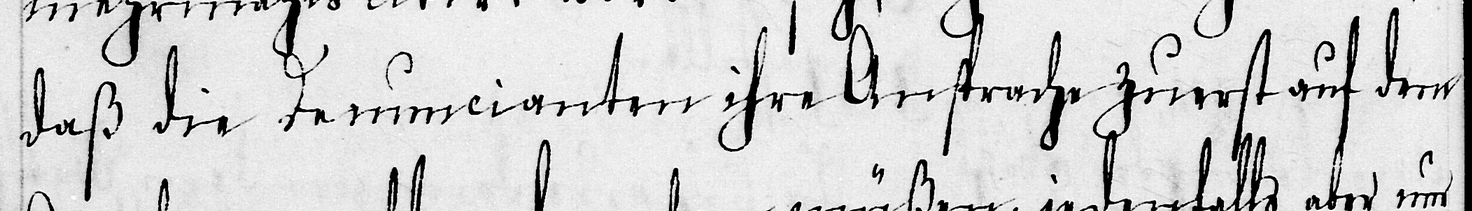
daß die Denuncianten ihre Ansprache zuerst auf dem
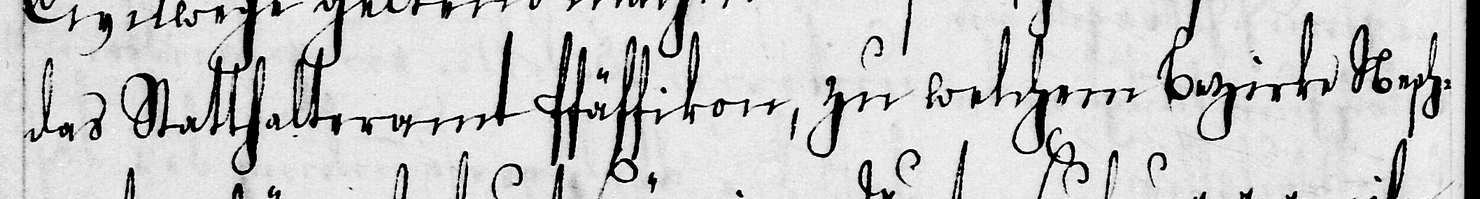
das Statthalteramt Pfäffikon, zu welchem Bezirke Nesch¬
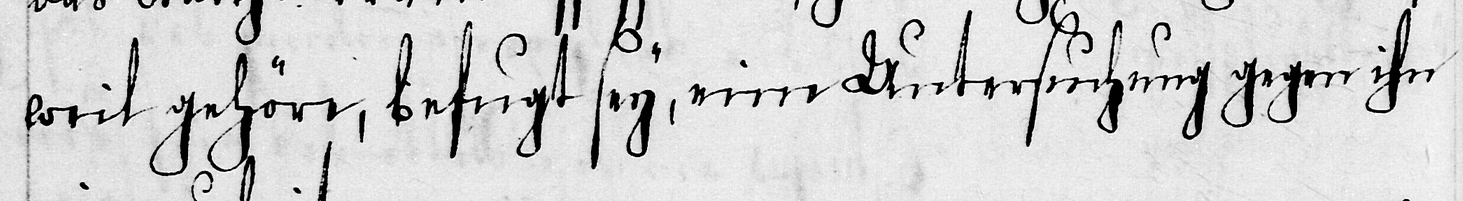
weil gehöre, befugt sey, eine Untersuchung gegen ihn
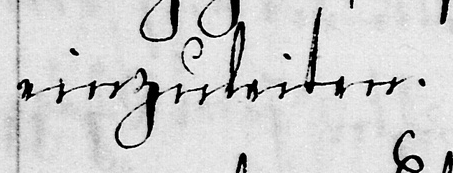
einzuleiten.
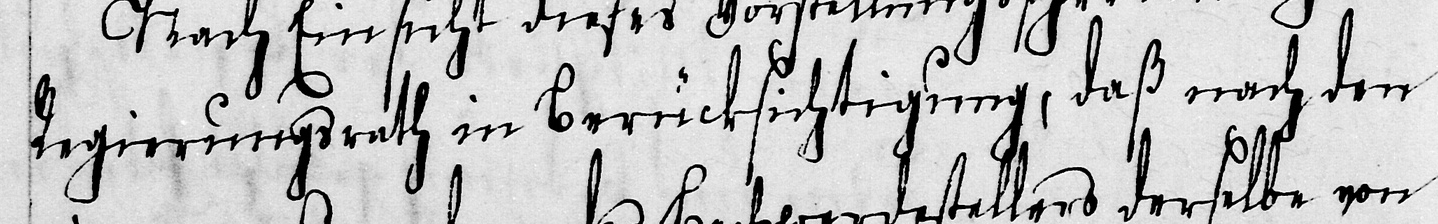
Regierungsrath in Berücksichtigung, daß nach den
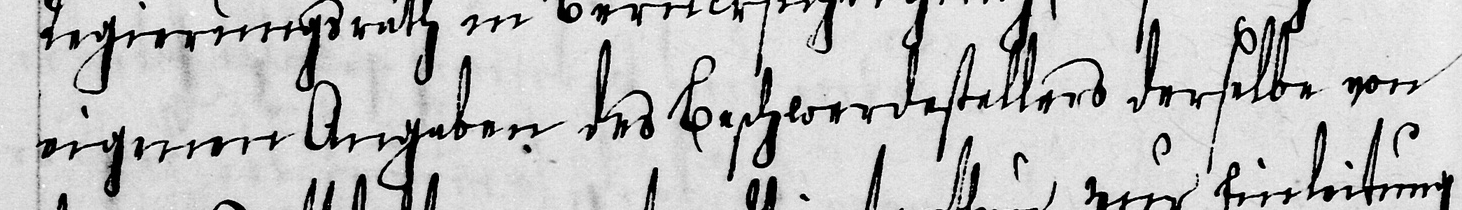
eigenen Angaben des Beschwerdestellers derselbe von
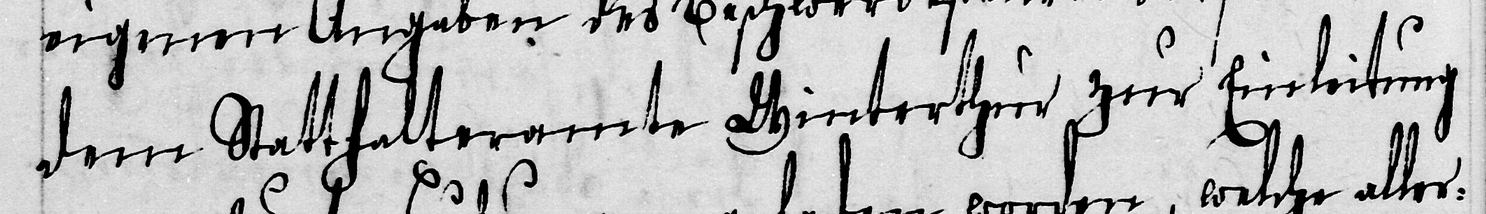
dem Statthalteramte Winterthur zur Einleitung
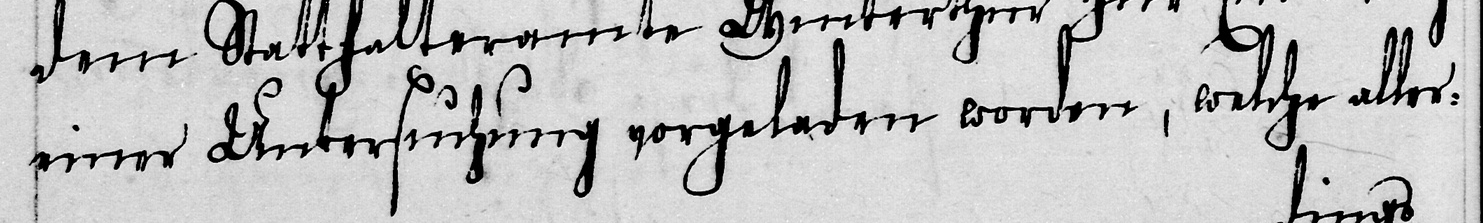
einer Untersuchung vorgeladen worden, welche alle¬
